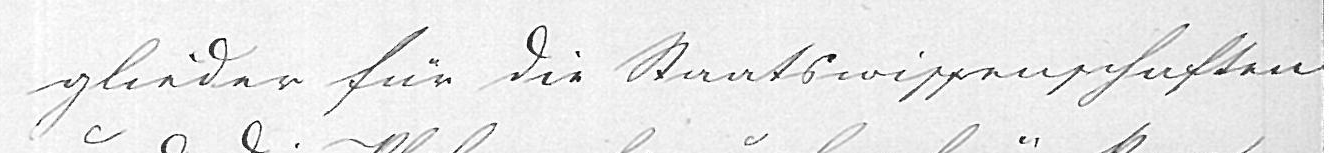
glieder für die Staatswissenschaften
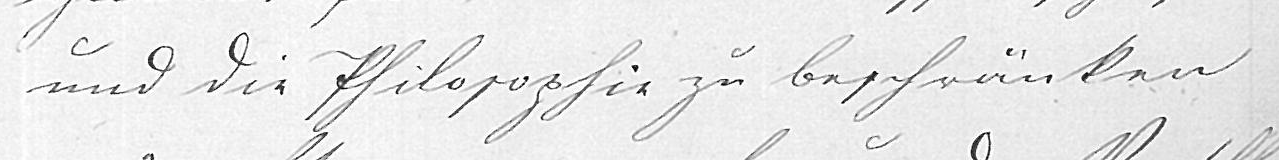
und die Philosophie zu beschränken
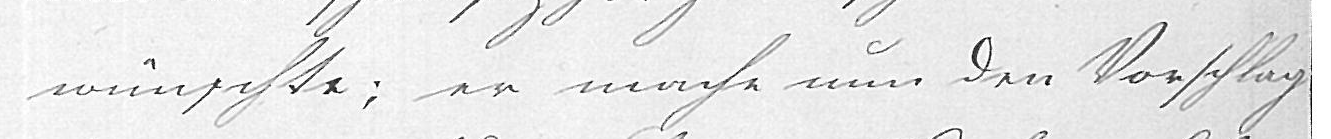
wünschte; er mache nur den Vorschlag-
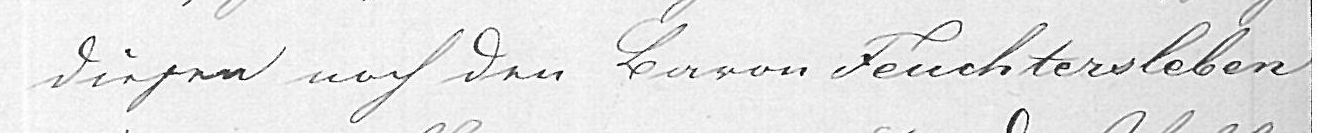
diesen noch den Baron Feuchtersleben
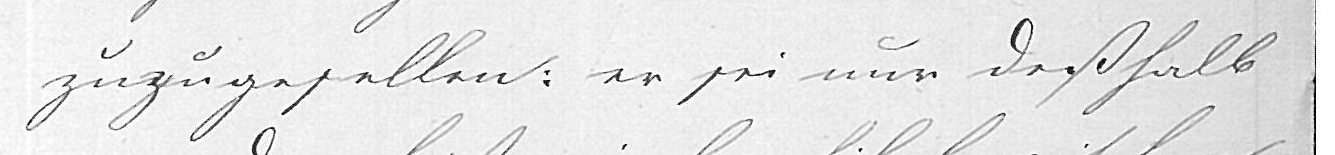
zuzugesellen: er sei nur deßhalb
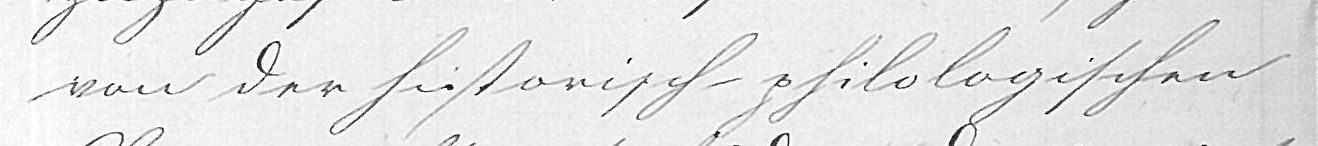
von der historisch-philologischen
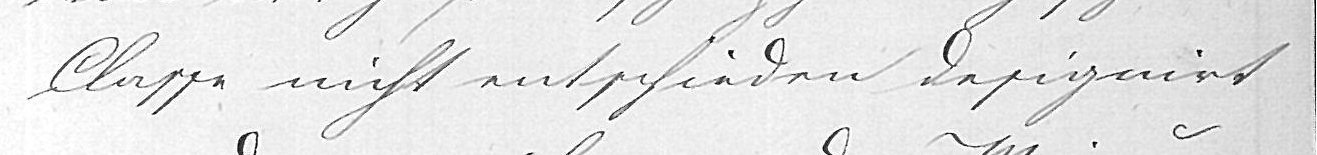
Classe nicht entschieden desigirt
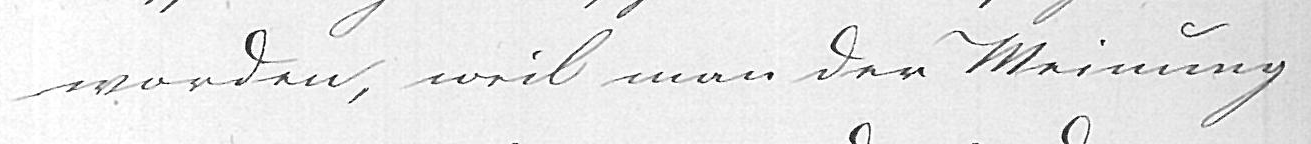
worden, weil man der Meinung
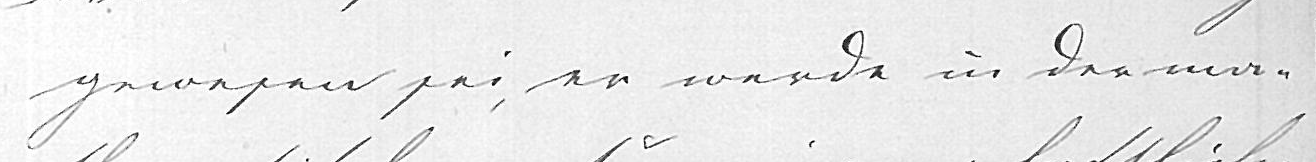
gewesen sei, er werde in der ma-
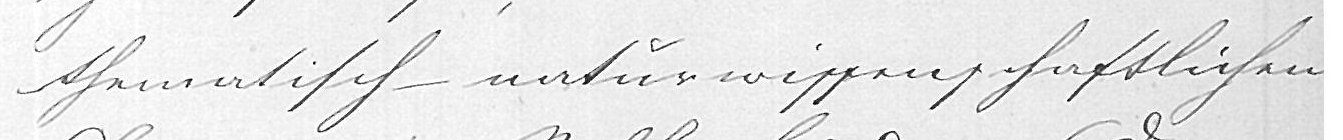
thematisch-naturwissenschaftlichen
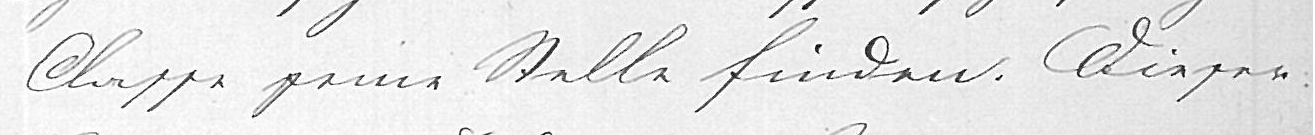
Classe seine Stelle finden. Dieser
